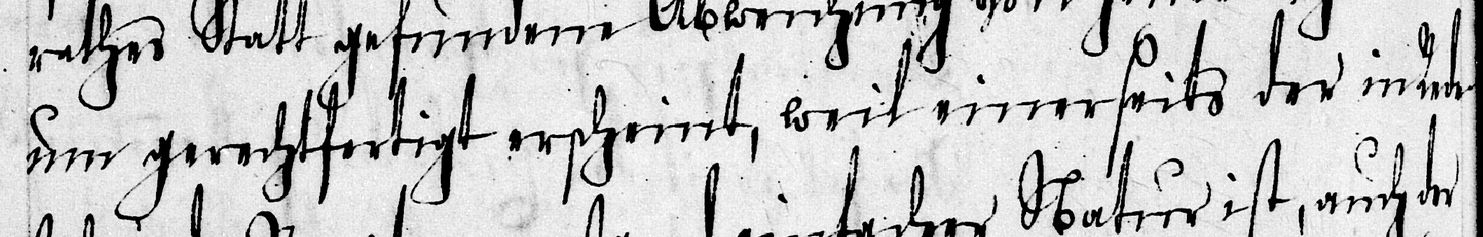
um gerechtfertigt erscheint, weil einerseits der in Re¬
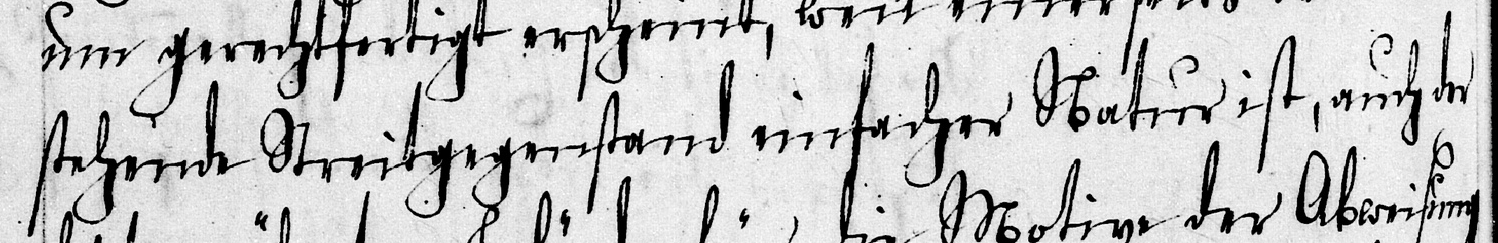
stehende Streitgegenstand einfacher Natur ist, auch d¬
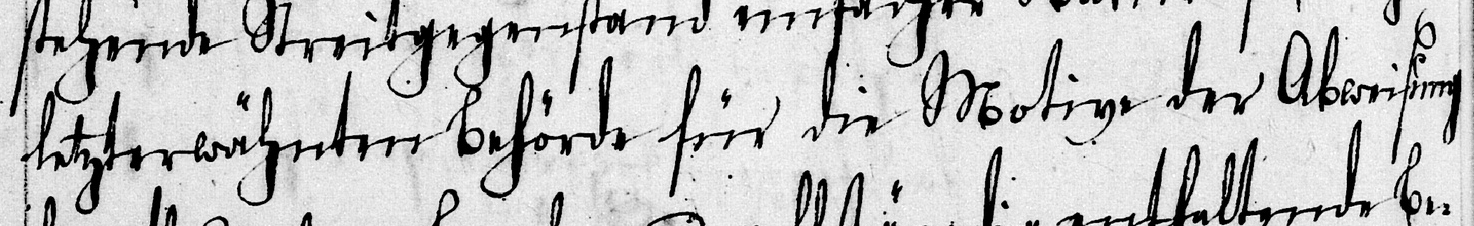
letzterwähnten Behörde für die Motive der Abweisung
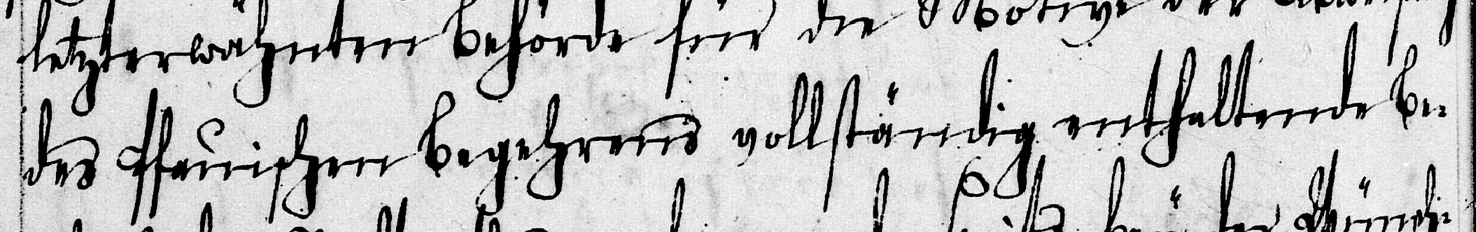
des Pfauischen Begehrens vollständig enthaltende Be¬
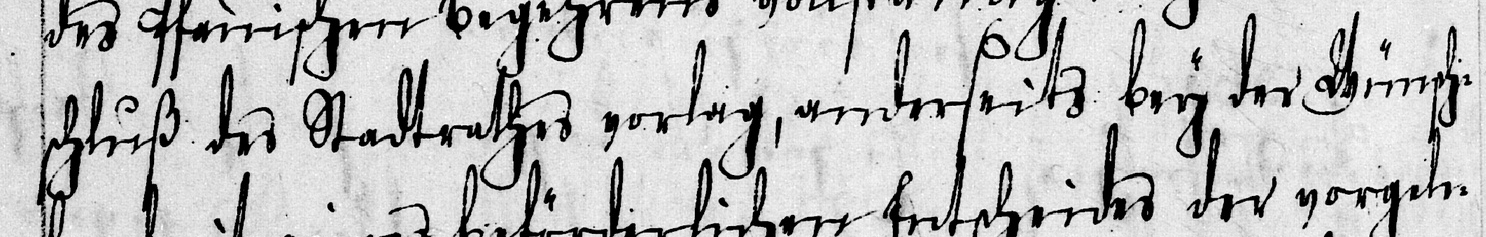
schluß des Stadtrathes vorlag, anderseits bey der Wünsch¬
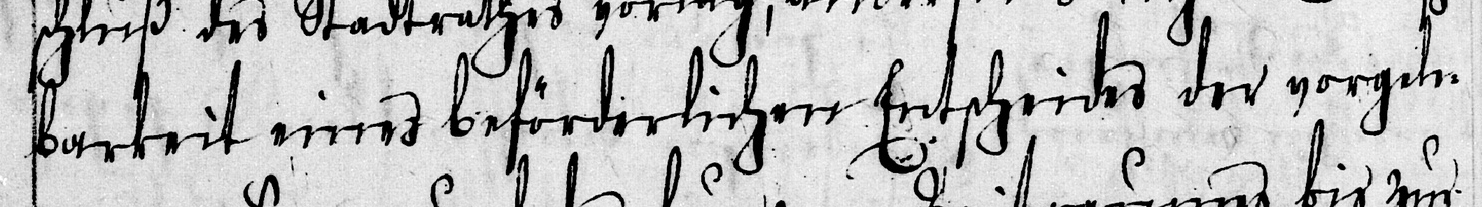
barkeit eines beförderlichen Entscheides der vorgele¬
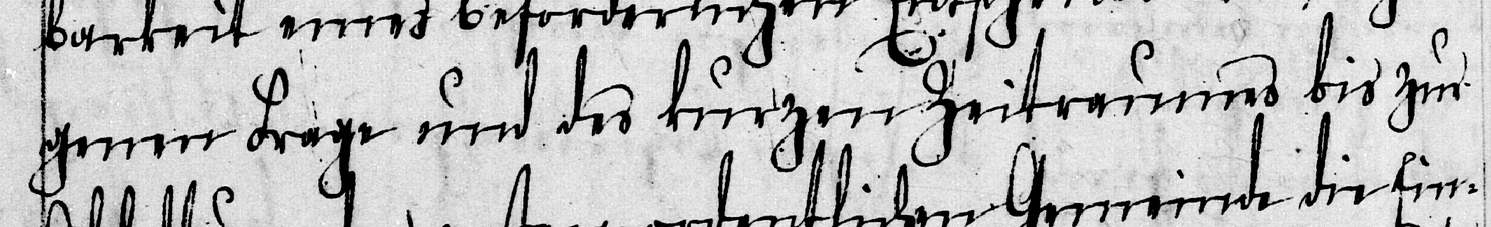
genen Frage und des kurzen Zeitraumes bis zur
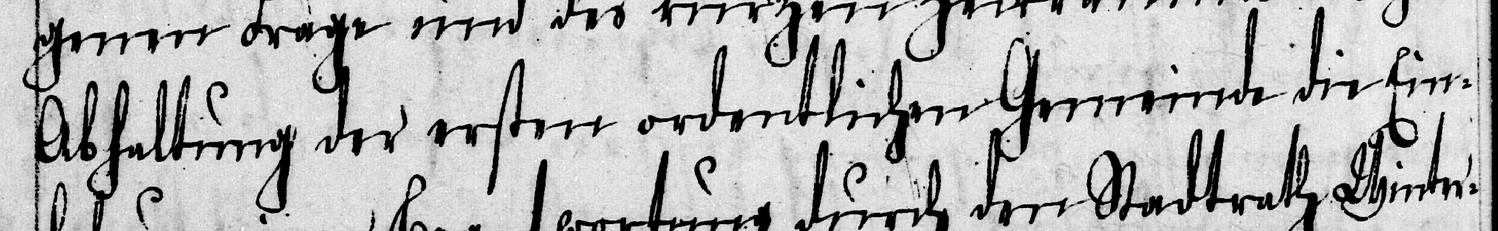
Abhaltung der ersten ordentlichen Gemeinde die Ein¬
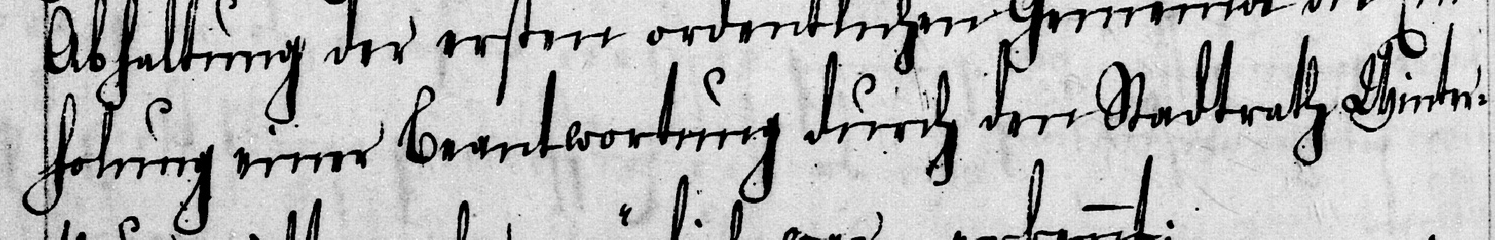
holung einer Beantwortung durch den Stadtrath Winte¬
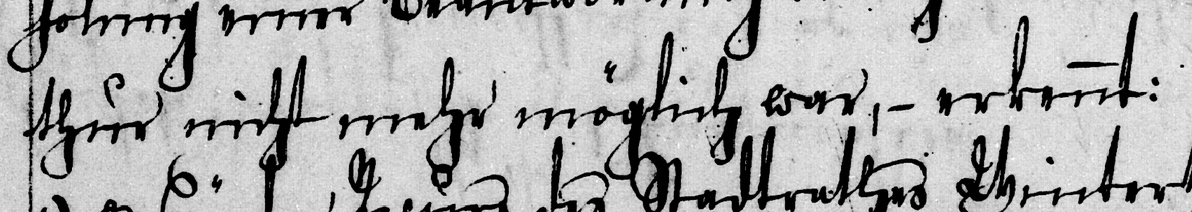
rthur nicht mehr möglich war, – erkennt:
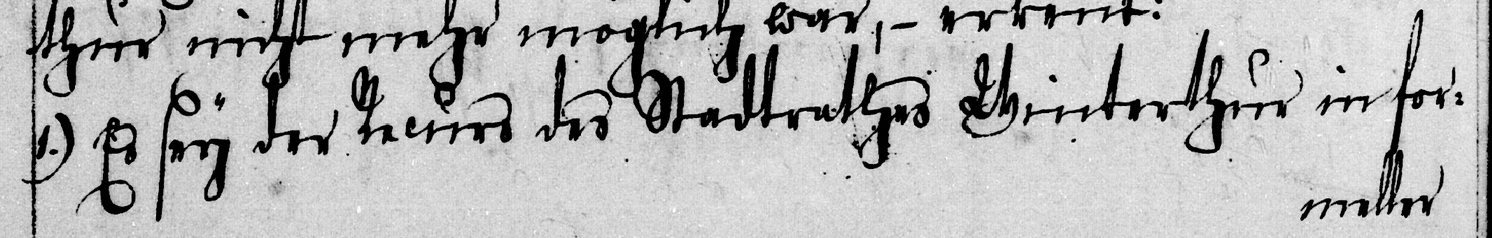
1.) Es sey der Recurs des Stadtrathes Winterthur in for-
